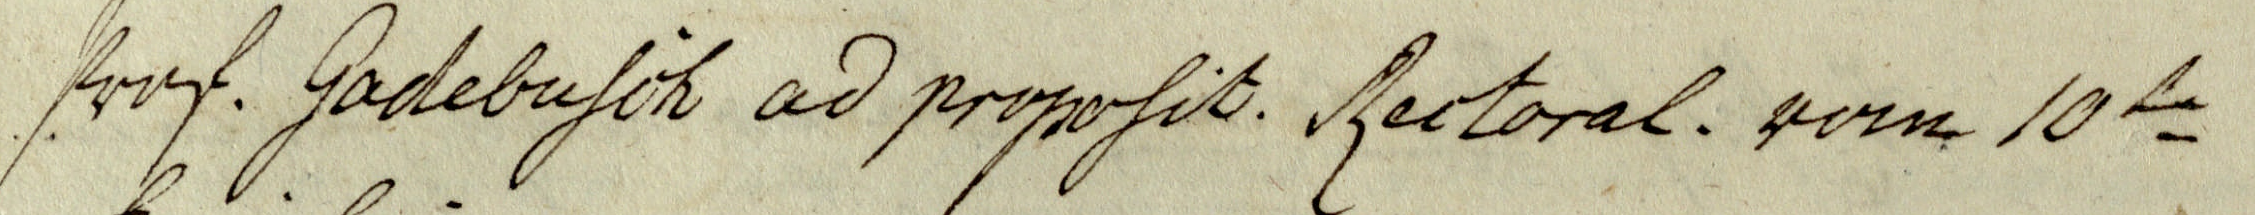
Prof. Gadebusch ad proposit. Rectoral. vom 10t.
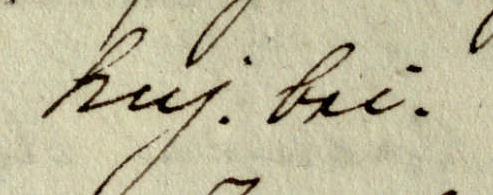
huj. bei.
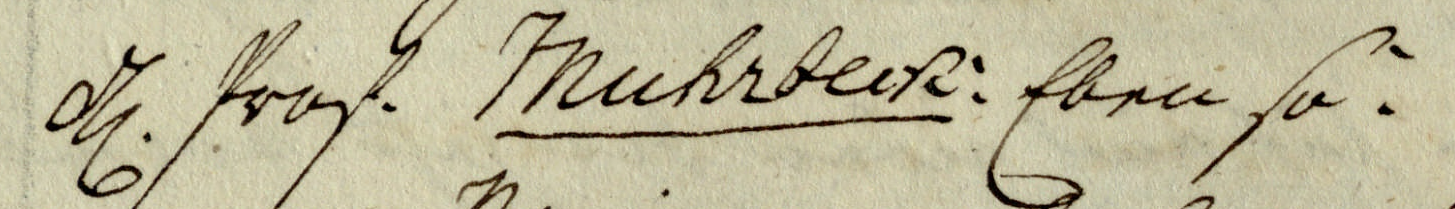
dh. Prof. Muhrbeck. Eben so.
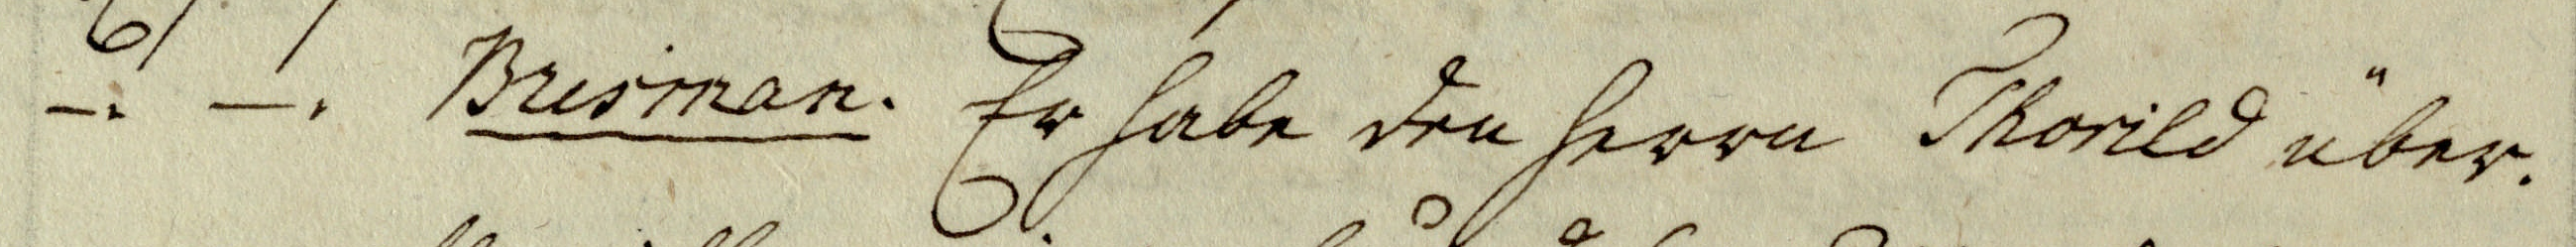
— " — " Brisman. Er habe den Herrn Thorild über¬
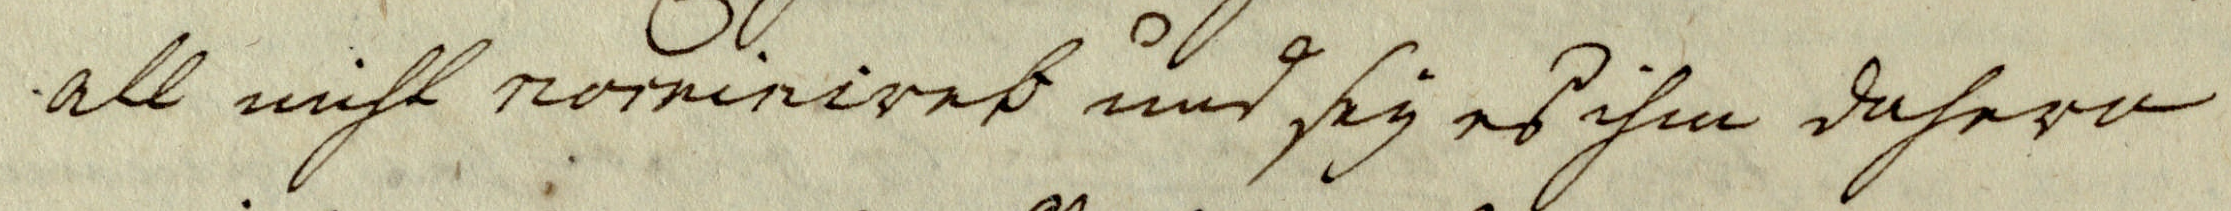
all nicht nominiret und seÿ es ihm dahero
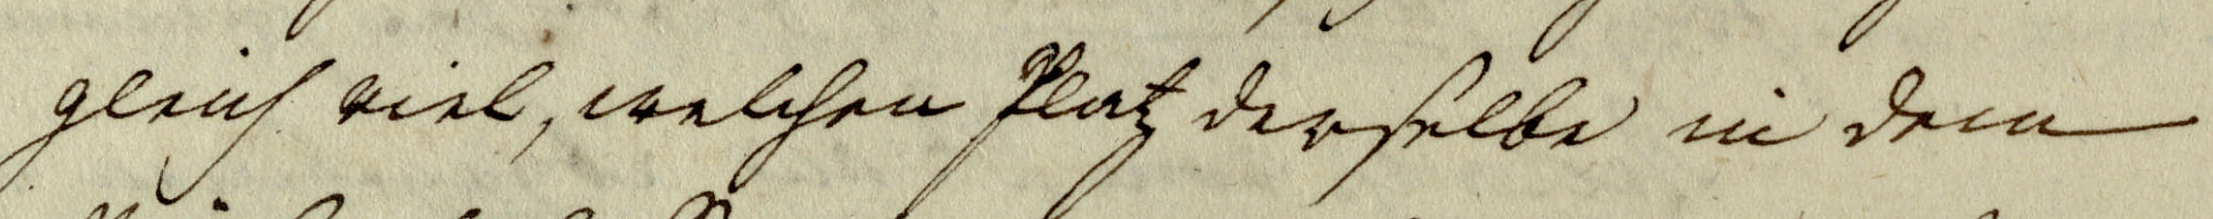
gleich viel, welchen Platz derselbe in dem
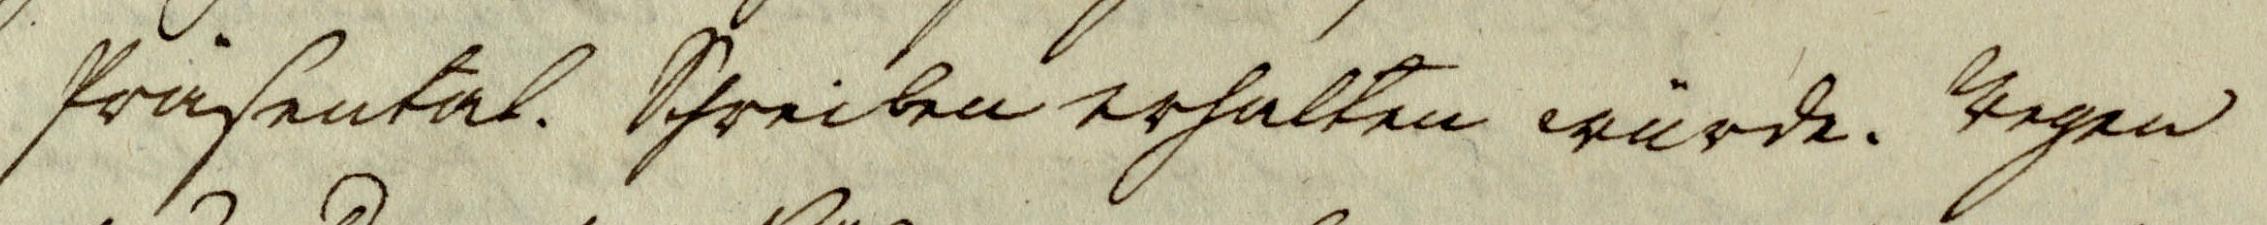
Präsentat. Schreiben erhalten würde. Wegen
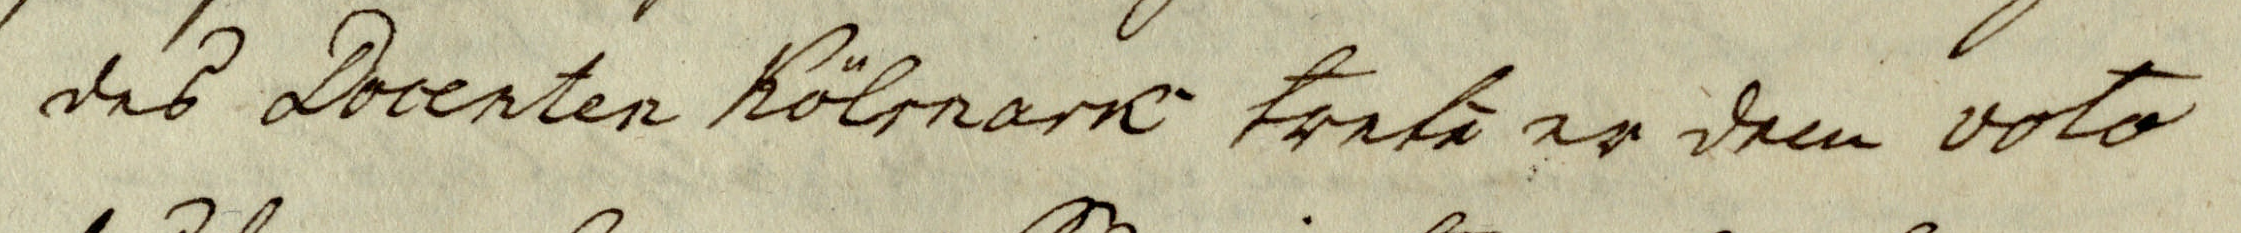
des Docenten Kölmark trete er dem voto
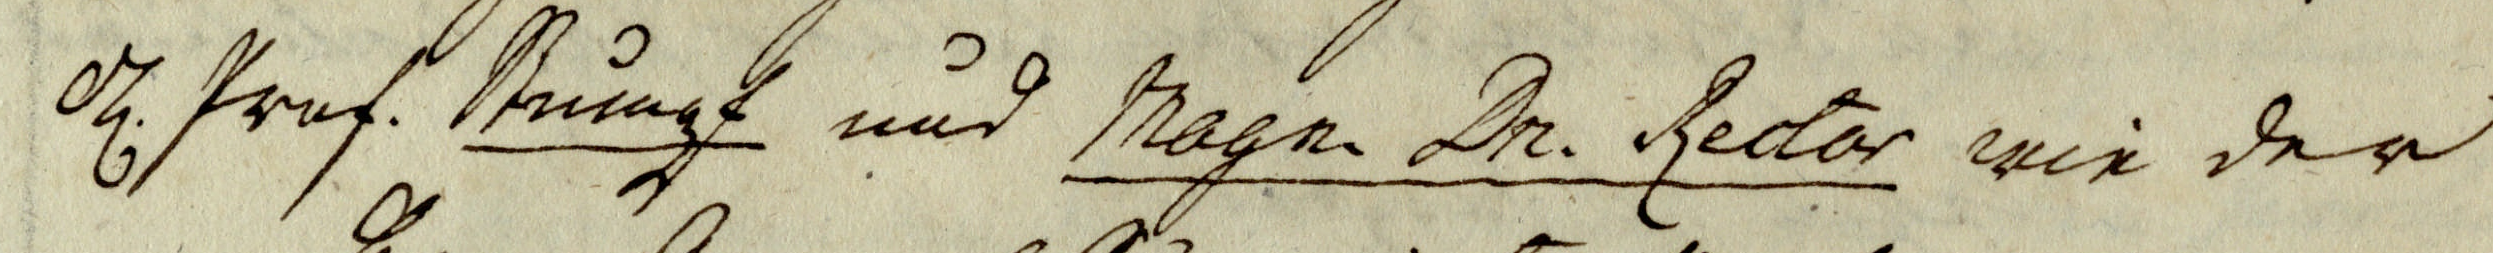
dh. Prof. Stumpf und Magn. Dn. Rector wie der
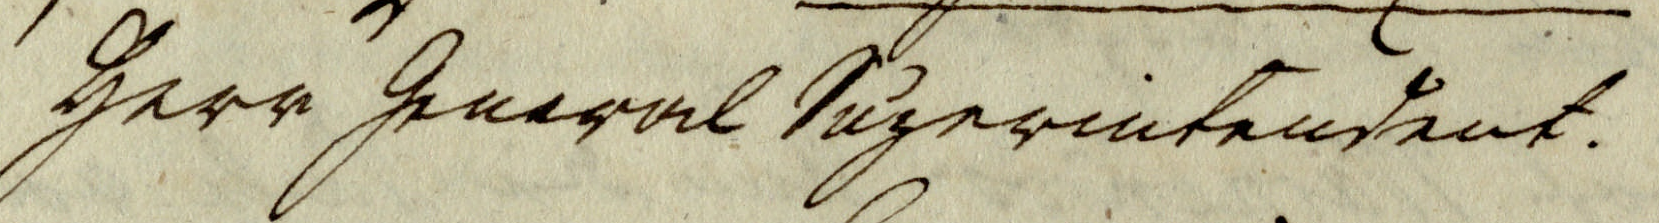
Herr General Superintendent.
